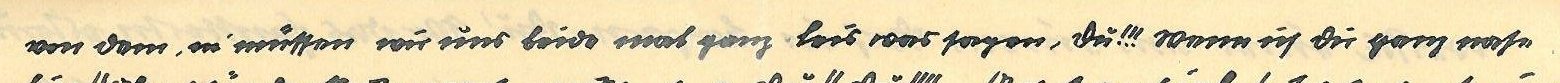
von dem „m” müssen wir uns beide mal ganz leis was sagen, Du!!! Wenn ich Dir ganz nahe
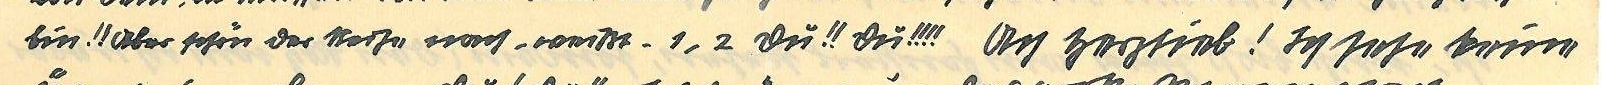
bin!! Aber schön der Reihe nach, weißt – 1, 2 Du!! Du!!!! Ach Herzlieb! Ich sehe keine
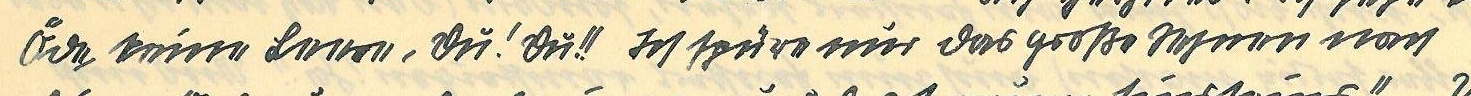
Öde, kein Leere, Du! Du!! Ich spüre nur das große Sehnen nach
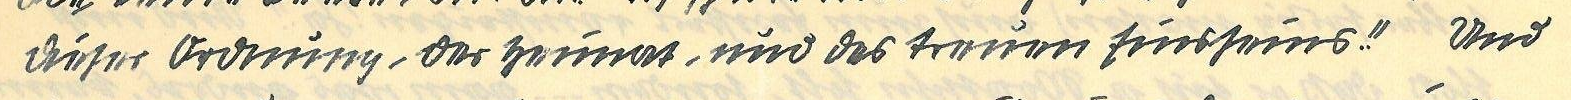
dieser Ordnung, der Heimat, und des treuen Einsseins!! Und
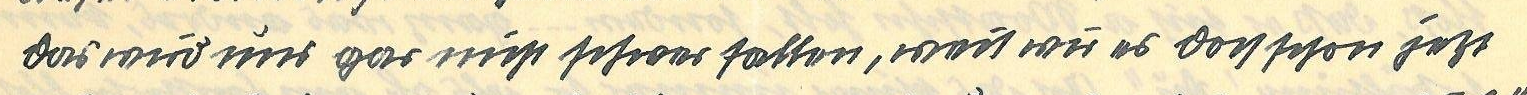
das wird uns gar nicht schwer fallen, weil wir es doch schon jetzt
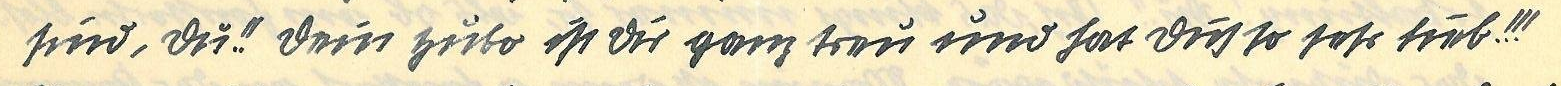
sind, Du!! Dein Hubo ist Dir ganz treu und hat Dich so sehr lieb!!!
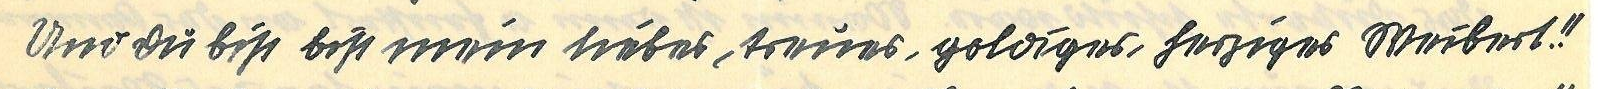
Und Du bist bist mein liebes, treues, goldiges, herziges Weiberl!!
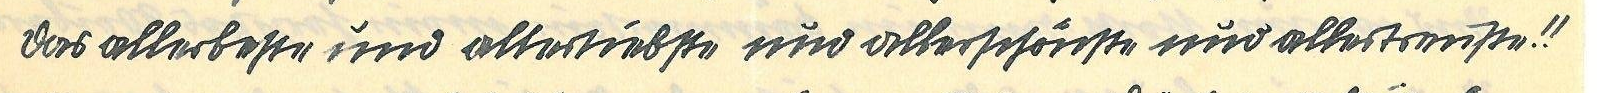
Das allerbeste und allerliebste und allerschönste und allertreuste!!
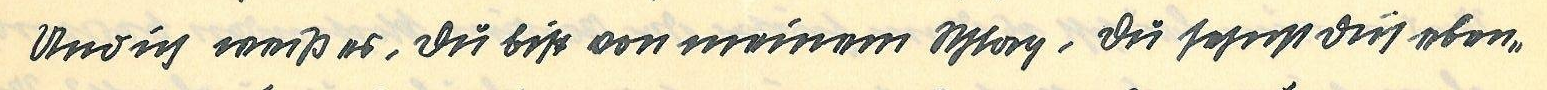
Und ich weiß es, Du bist von meinem Schlag, Du sehnst dich eben¬
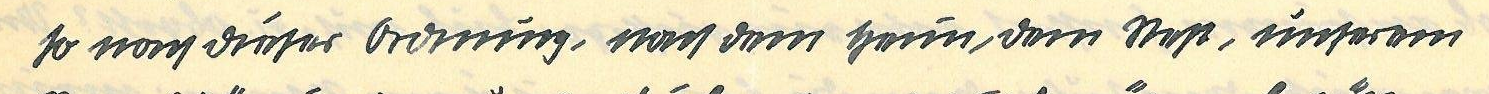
so nach dieser Ordnung, nach dem Heim, dem Nest, unserem
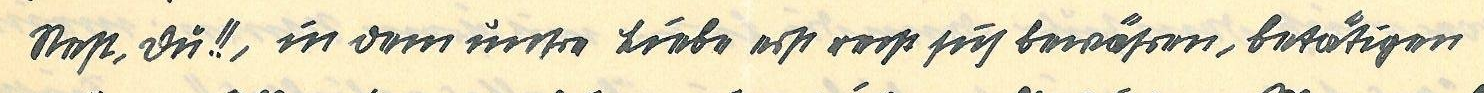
Nest, Du!!, in dem unsre Liebe erst recht sich bewähren, betätigen
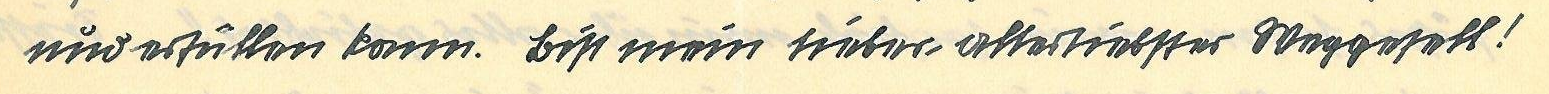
und erfüllen kann. Bist mein lieber, allerliebster Weggesell!
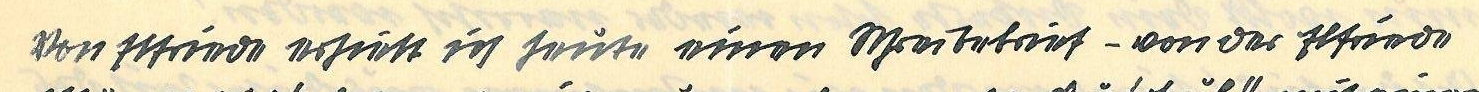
Von E. erhielt ich heute einen Schreibebrief – von der E.! –
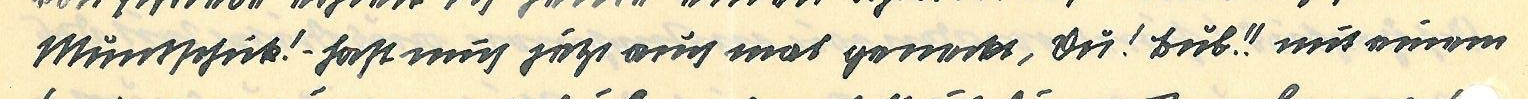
Munsschick! – Hast mich jetzt auch mal geneckt, Du! Bub!! mit einem
